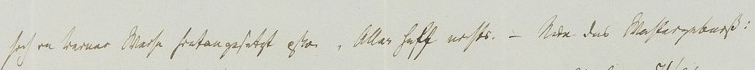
sich in keiner Weise hintangesetzt usw. Alles half nichts. – Nun das Wahlergebniß:
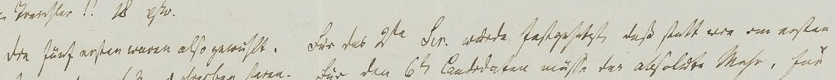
Die fünf ersten waren also gewählt. Für das 2te Scr. wurde festgesetzt, daß statt wie im ersten
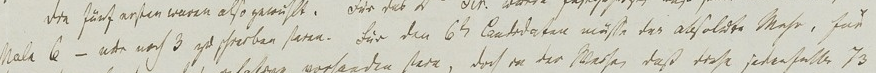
Male 6 – nur noch 3 zu schreiben seien. Für den 6ten Candidaten müsse das absolute Mehr, für
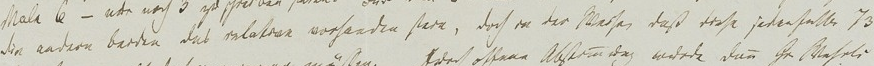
die andern beiden das relative vorhanden sein, doch in der Weise, daß diese jedenfalls 73
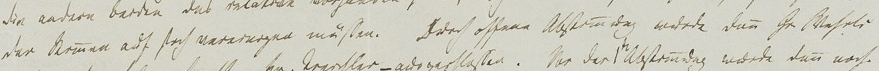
der Stimmen auf sich vereinigen müssen. Durch offene Abstimmung wurde dann Hr Wehrli
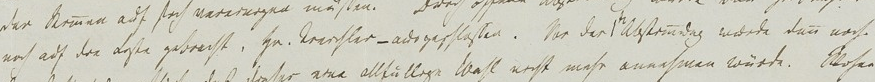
noch auf die Liste gebracht, Hr. Treichler – ausgeschlossen. Vor der 1ten Abstimmung wurde dann noch
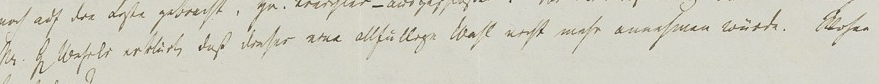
sts Hr Wehrli erklärt, daß dieser eine allfällige Wahl nicht mehr annehmen würde. Woher
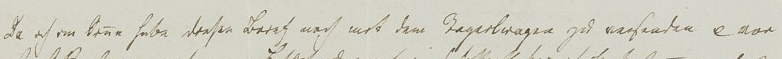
Da ich im Sinne habe diesen Brief noch mit dem Tageilwagen zu versenden & vor
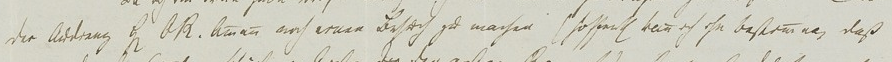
der Audienz Hr OR. Ammann noch einen Besuch zu machen (hoffentlich kann ich ihn bestimmen, daß
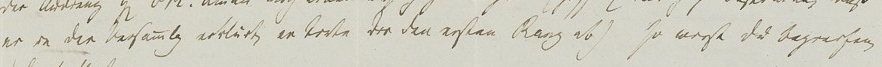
er in der Versammlung erklärt, er trete Dir den ersten Rang ab) so wirst Du begreifen,
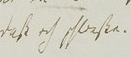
daß ich schließe
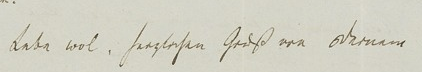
Lebe wohl, herzlichen Gruß von Deinem
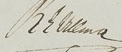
E Ullmer
